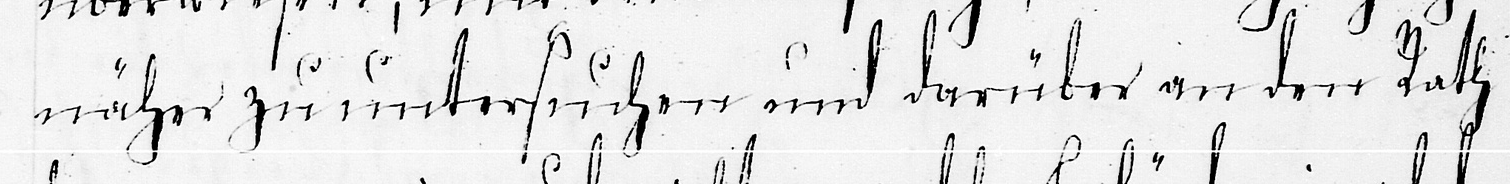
näher zu untersuchen und darüber an den Rath
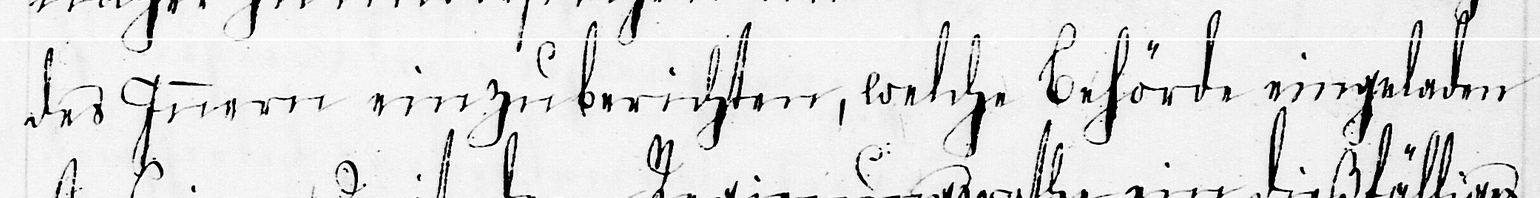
des Innern einzuberichten, welche Behörde eingeladen
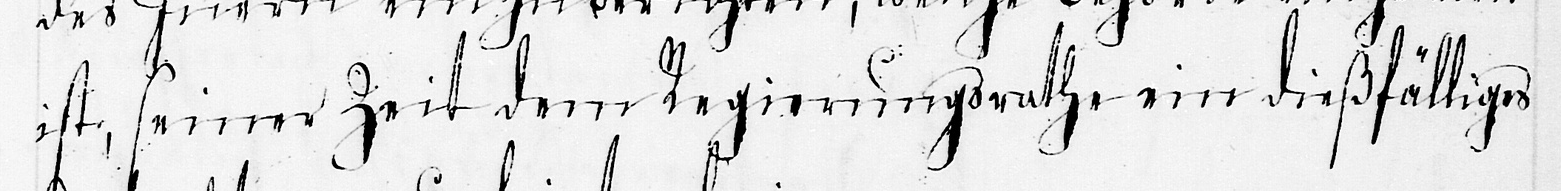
ist, seiner Zeit dem Regierungsrathe ein dießfälliges
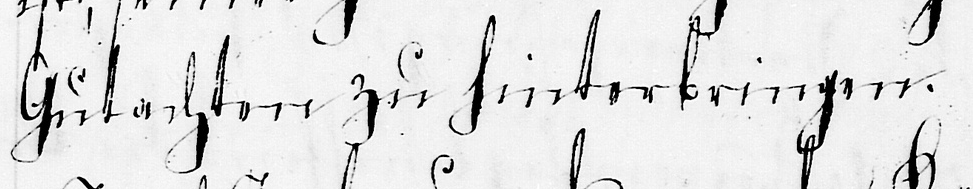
Gutachten zu hinterbringen.
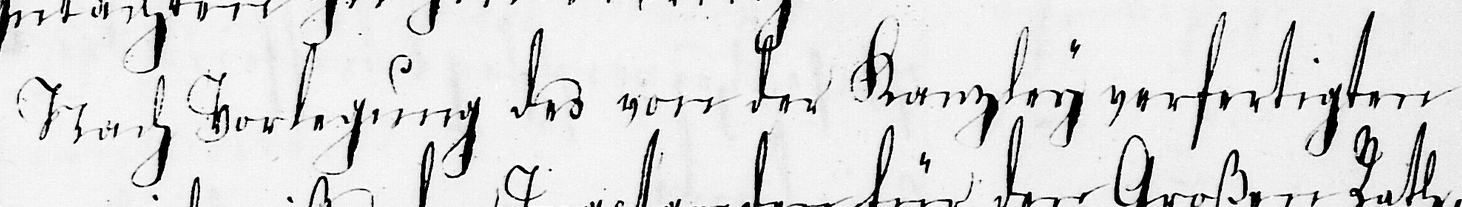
Nach Vorlegung des von der Kanzley verfertigten
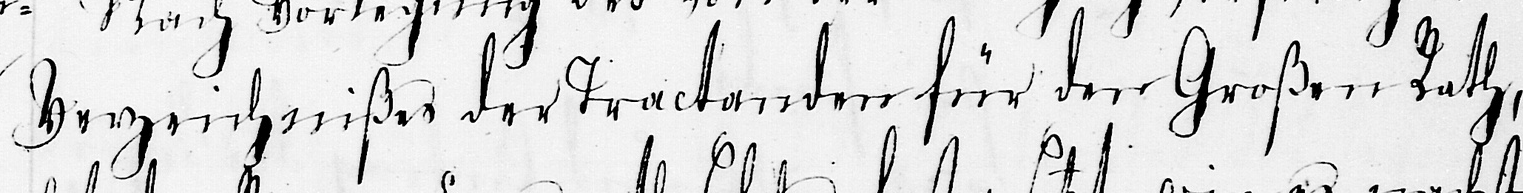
Verzeichnißes der Tractanden für den Großen Rath,
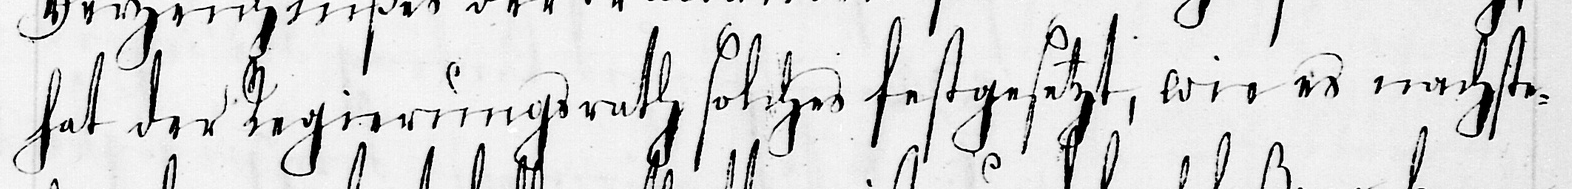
hat der Regierungsrath solches festgesetzt, wie es nachste¬
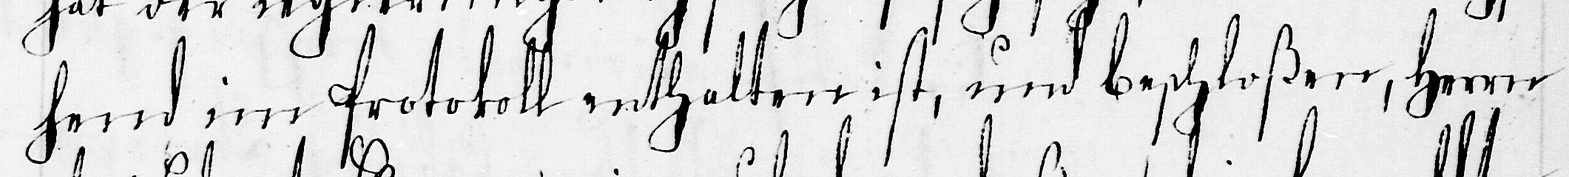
hend im Protokoll enthalten ist, und beschloßen, Herrn
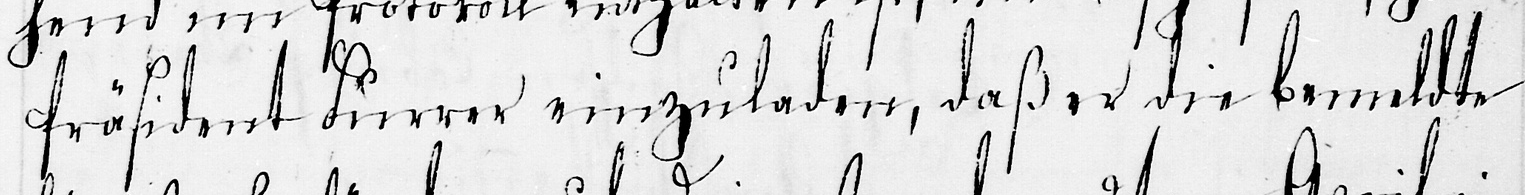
Präsident Furrer einzuladen, daß er die bemeldte
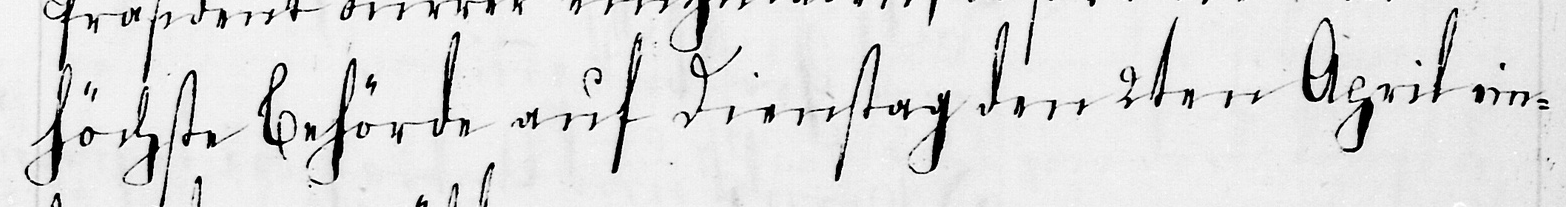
höchste Behörde auf Dienstag den 2ten April ein¬
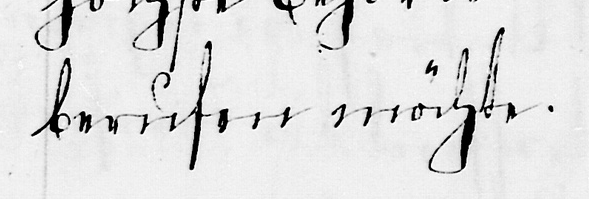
berufen möchte.
